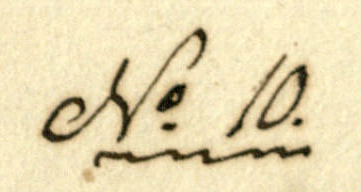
No 10.
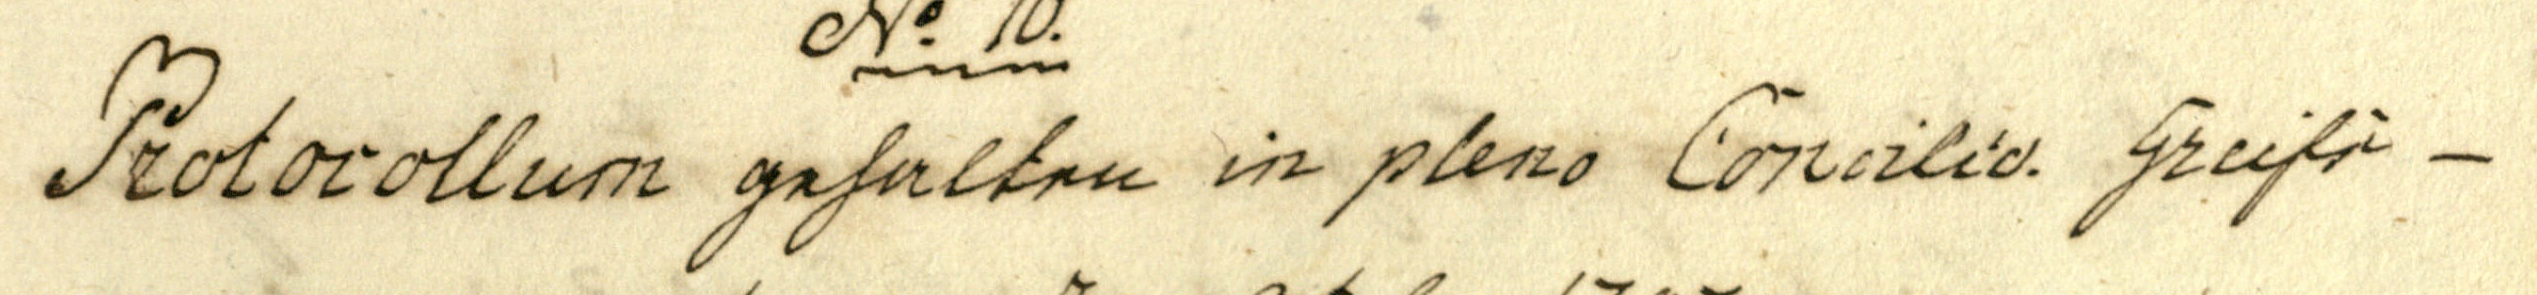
Protocollum gehalten in pleno Concilio Greifs¬
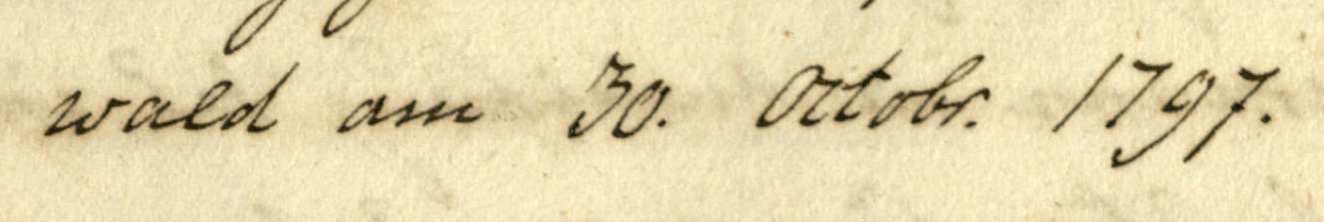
wald am 30. Octobr. 1797.
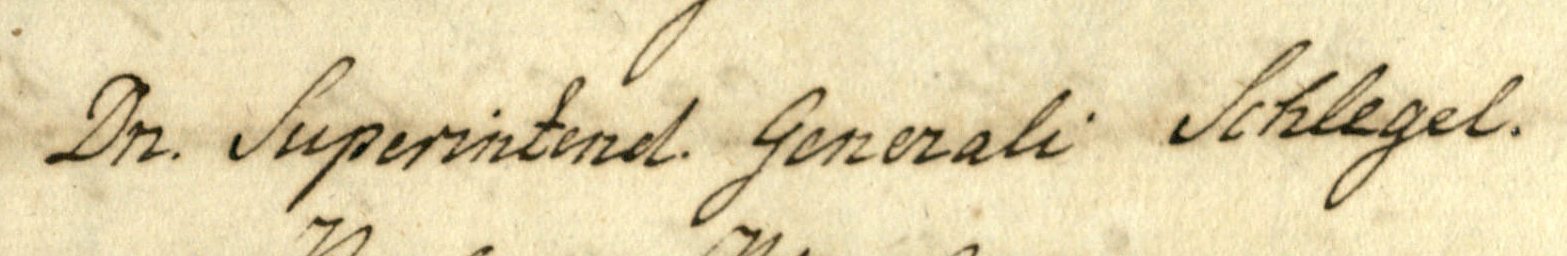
Dn. Superintend. Generali Schlegel.
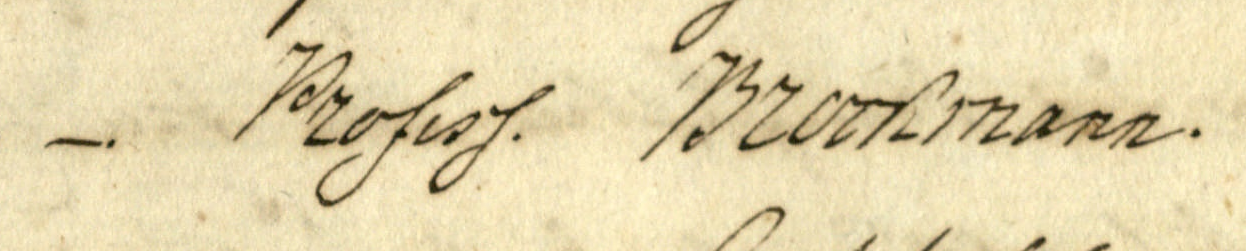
Profess. Brockmann.
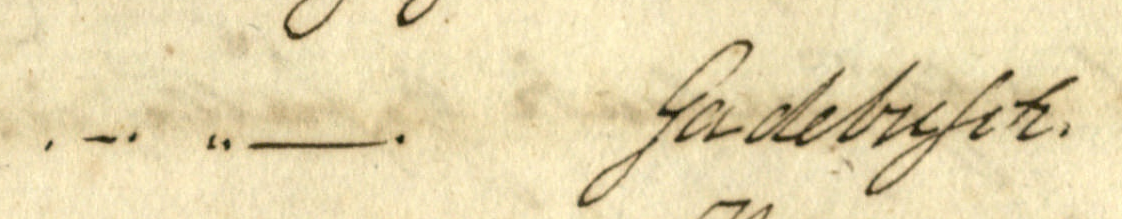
Gadebusch.
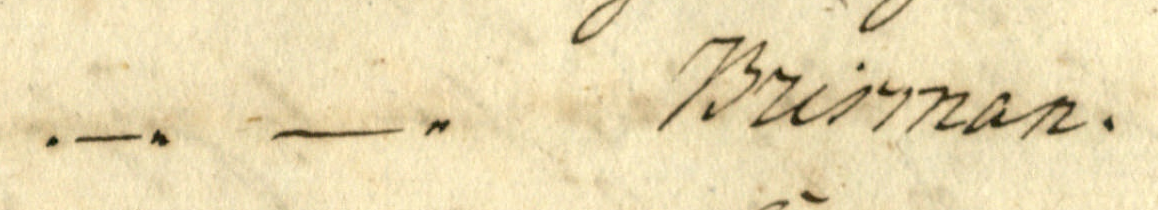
Brisman.
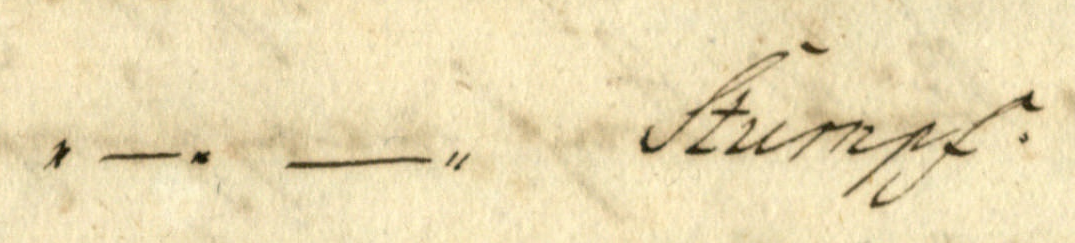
Stumpf.
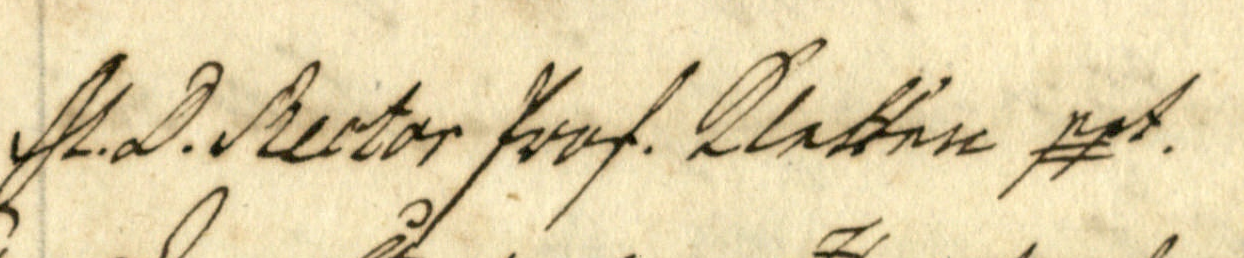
M. D. Rector Prof. Kletten ppt.
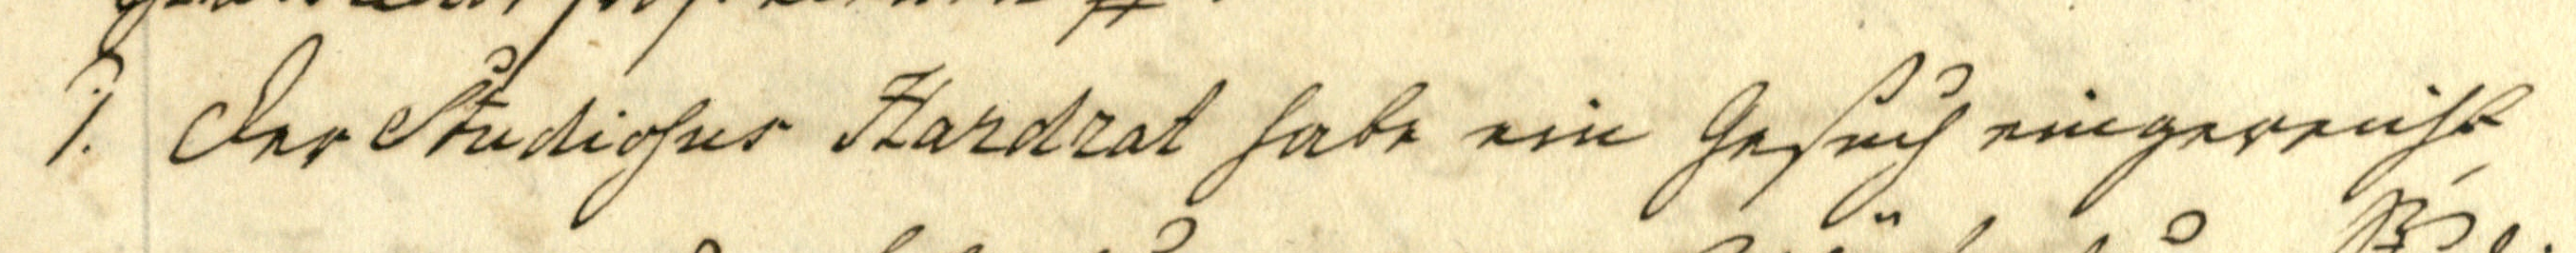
1. Der Studiosus Hardrat habe ein Gesuch eingereicht,
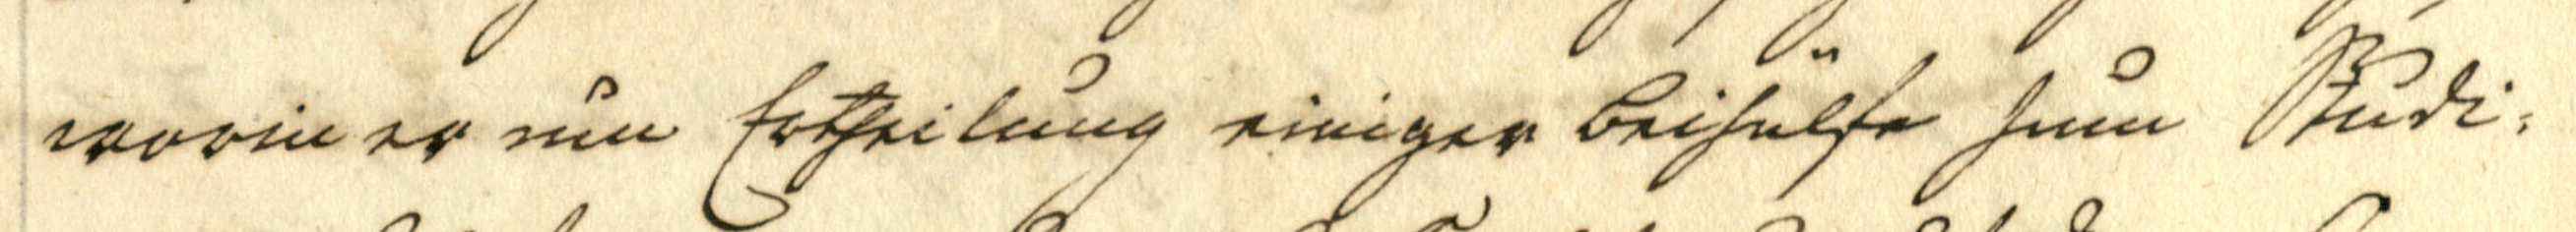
worin er um Ertheilung einiger Beihülfe zum Studi¬
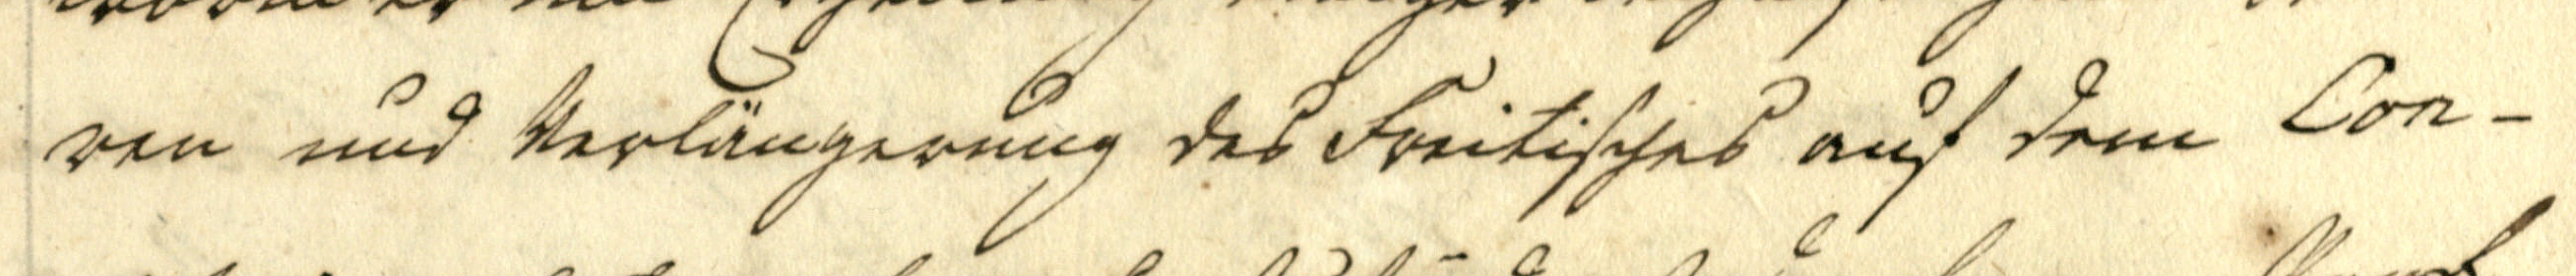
ren und Verlängerung des Feitisches auf dem Con¬
